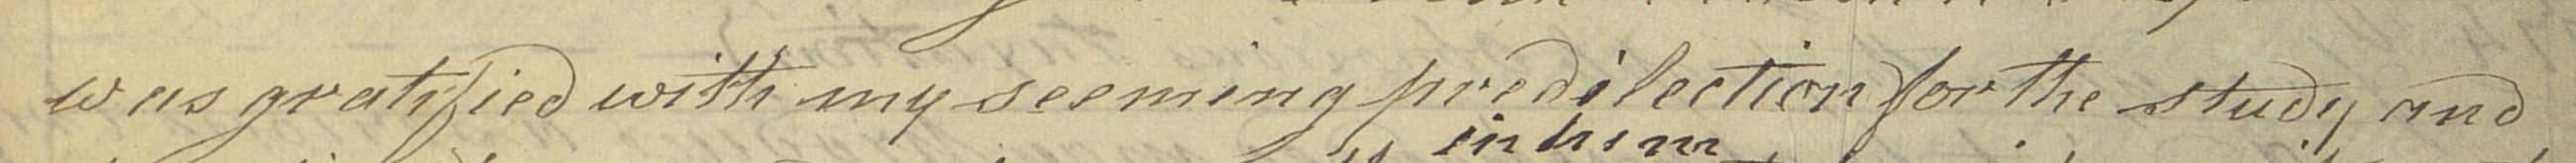was gratified with my seeming predilection for the study and
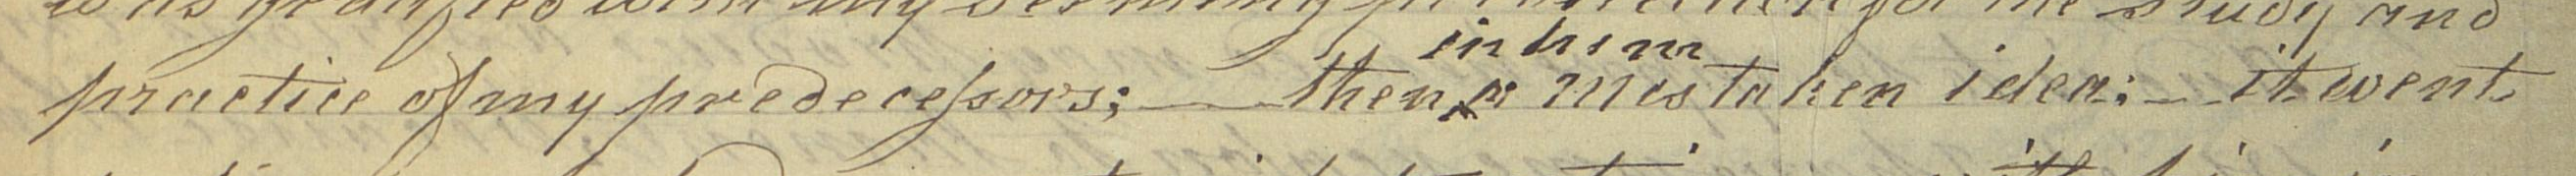practice of my predecessors;- then ^ as mistaken idea: it went
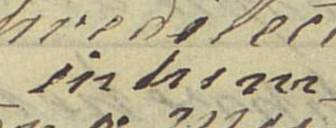in him
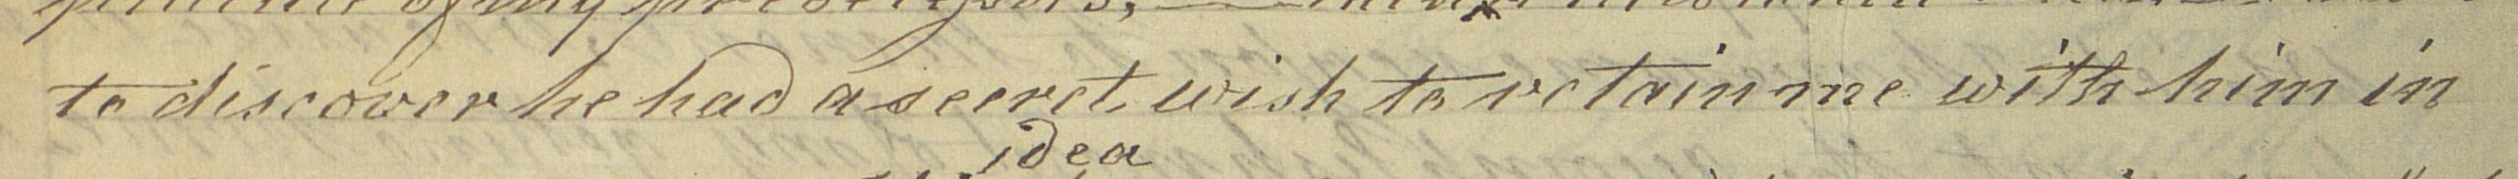to discover he had a secret wish to retain me with him in
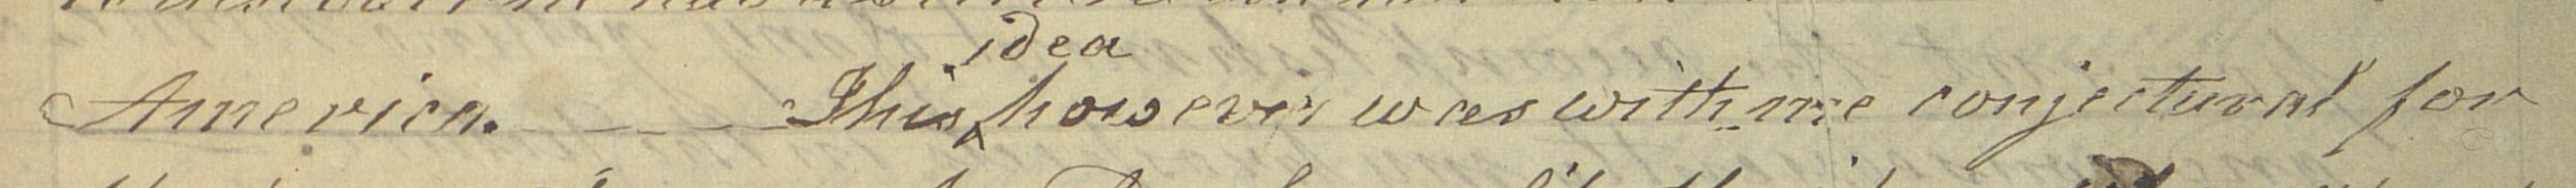America. This ^ however was with me conjectural for
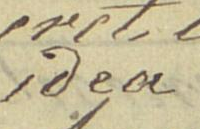idea
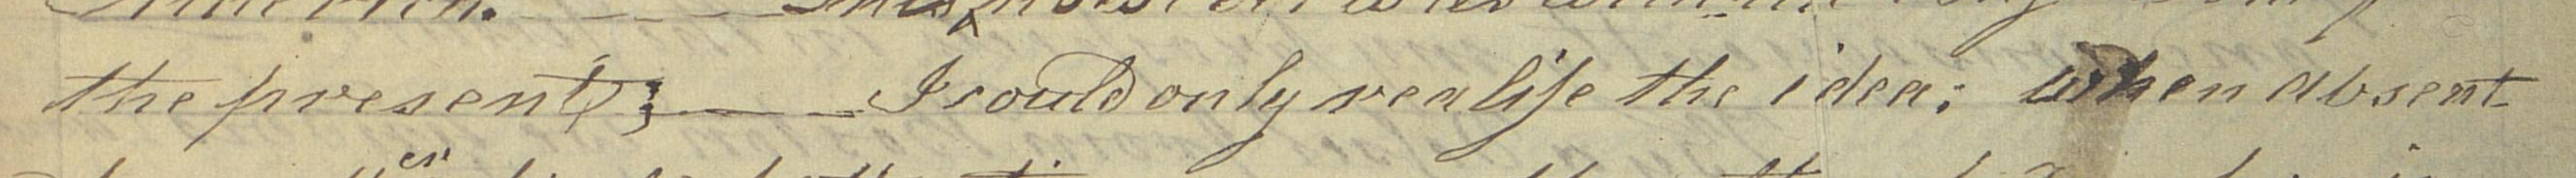the present; I could only realise the idea: when absent
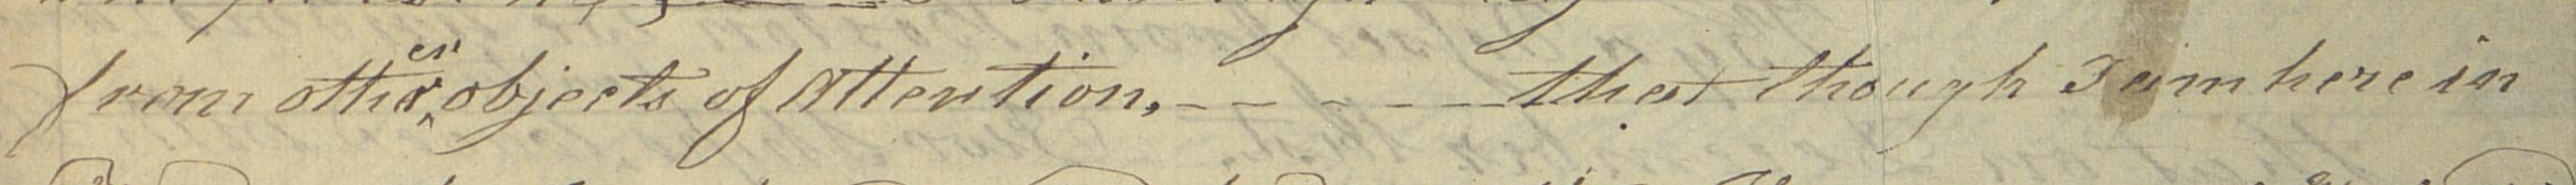from other objects of attention. that though I am here in
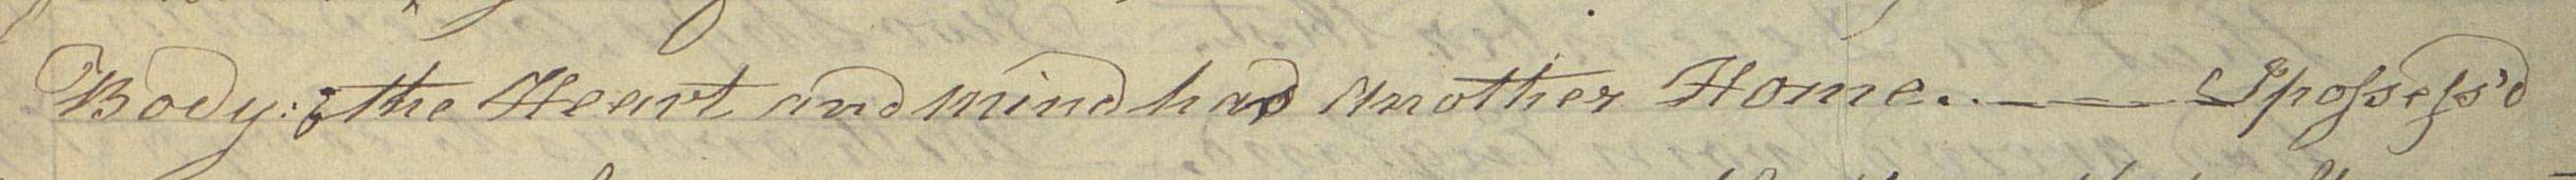Body; & the Heart and mind and mother Home.- I possess'd
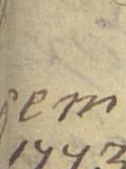-em
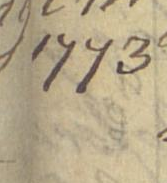1773
